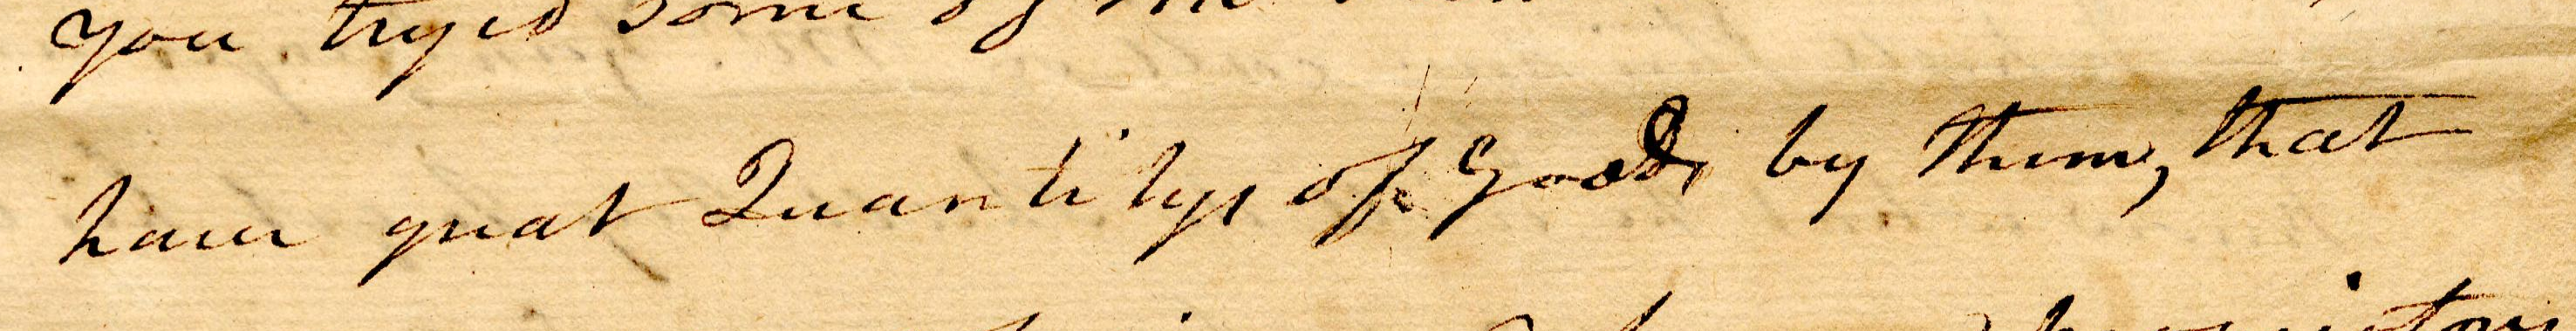have great Quantitys of Goods, by them, that
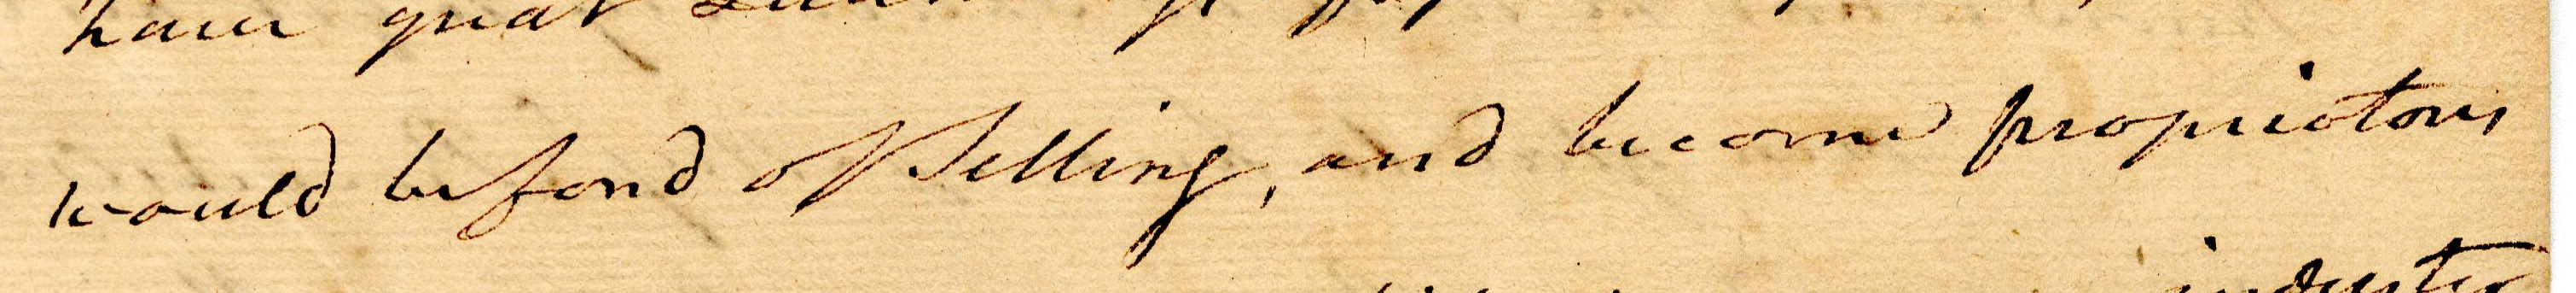would be fond of Selling, and become proprietors
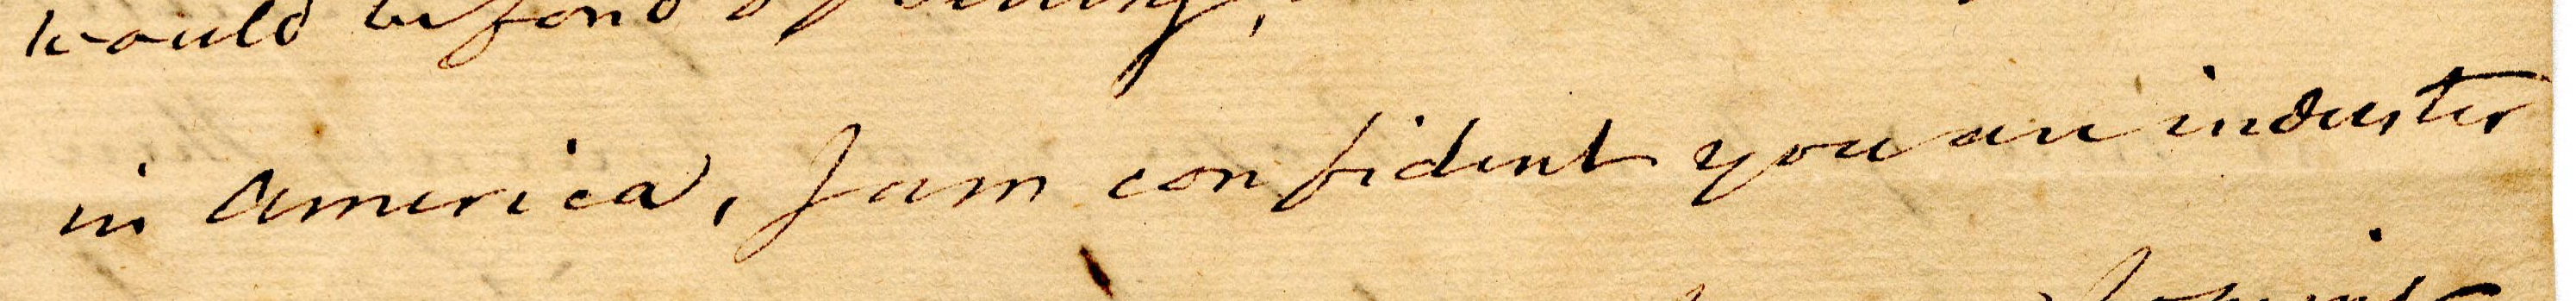in America, I am confident you are induster-
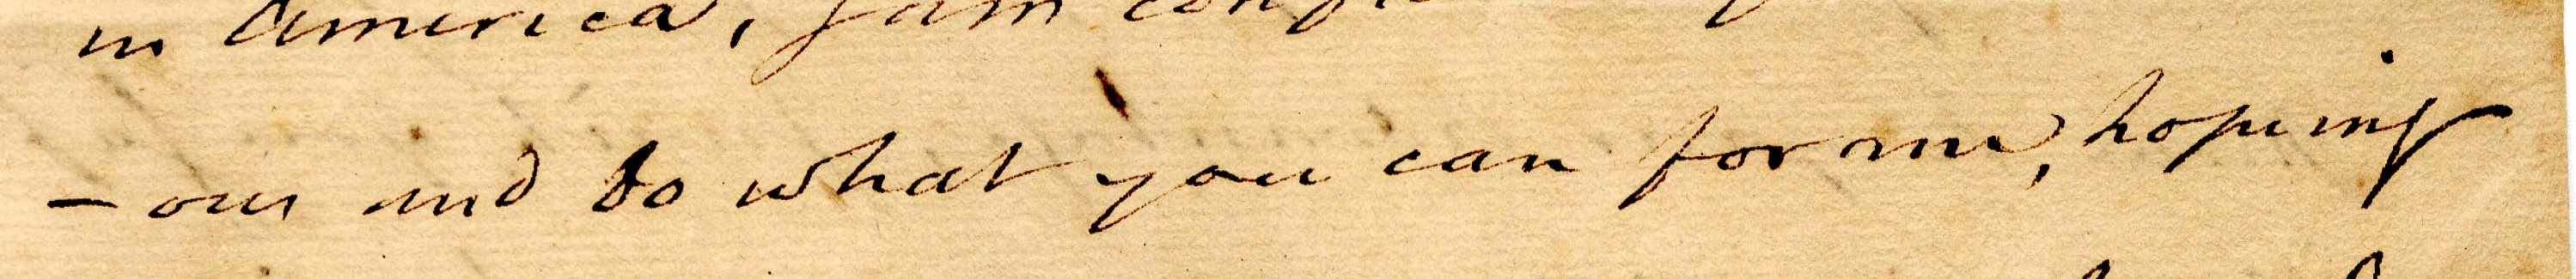-ous and to what you can for me, hopeing
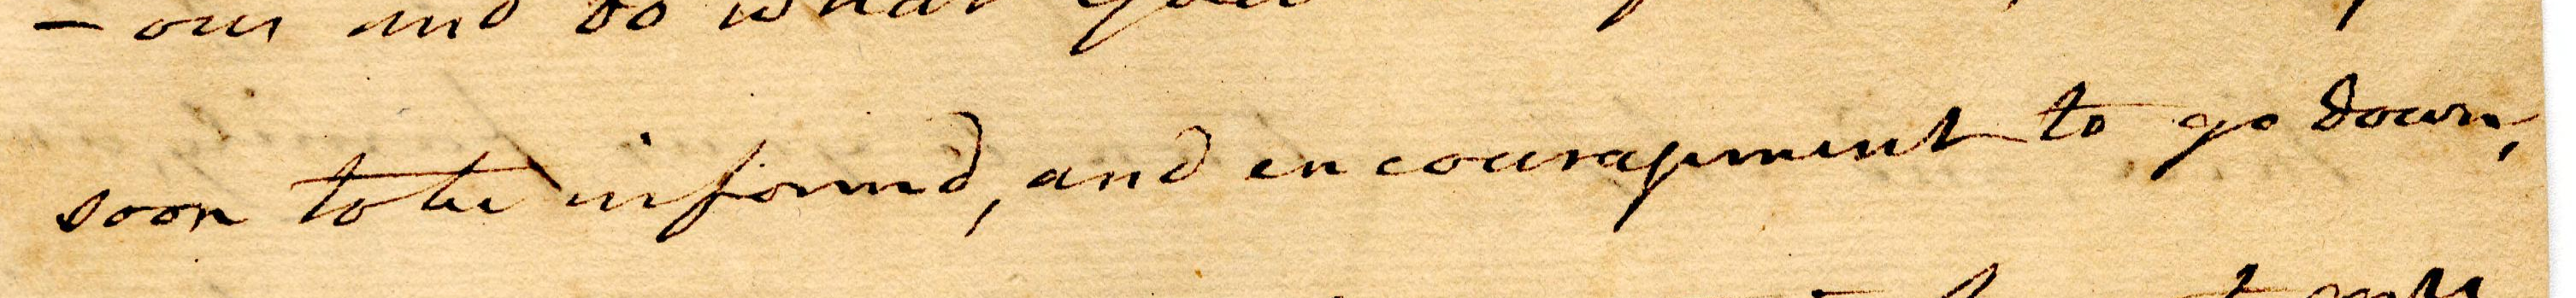soon to be inform'd, and encouragement to go down,
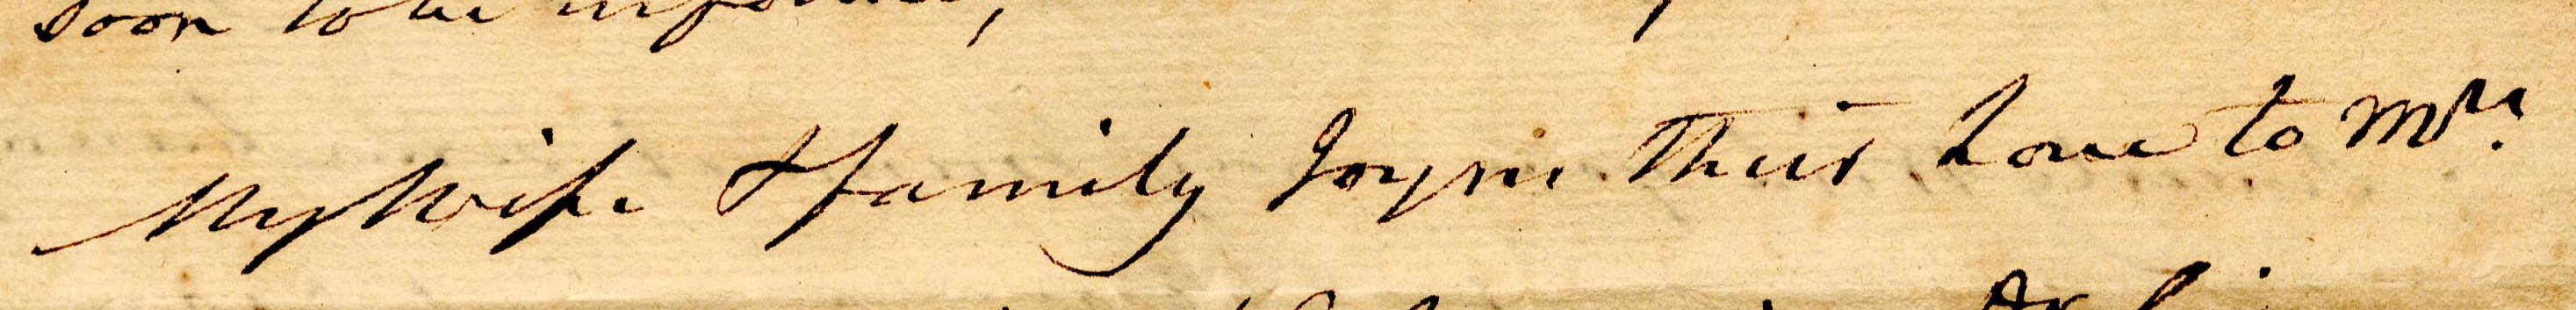My wife & family Joyns their Love to M^rs.
